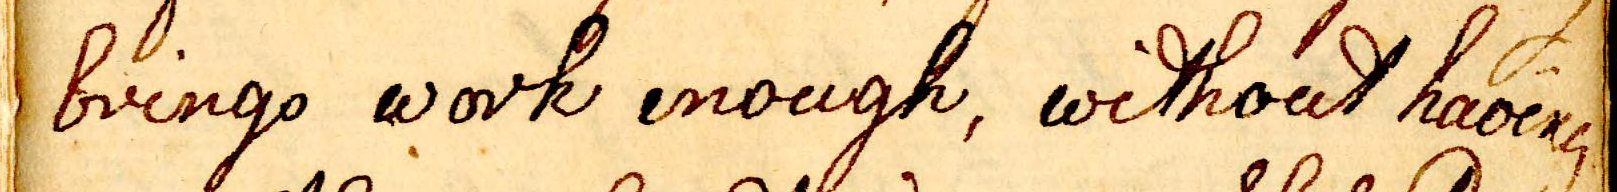brings work enough, without having
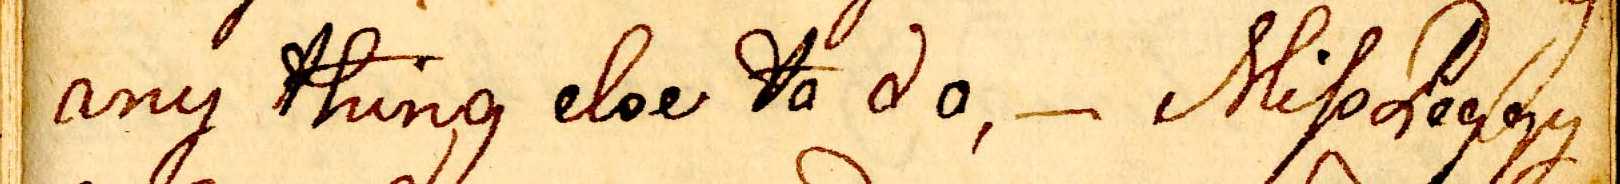any thing else to do,- Miss Peggy
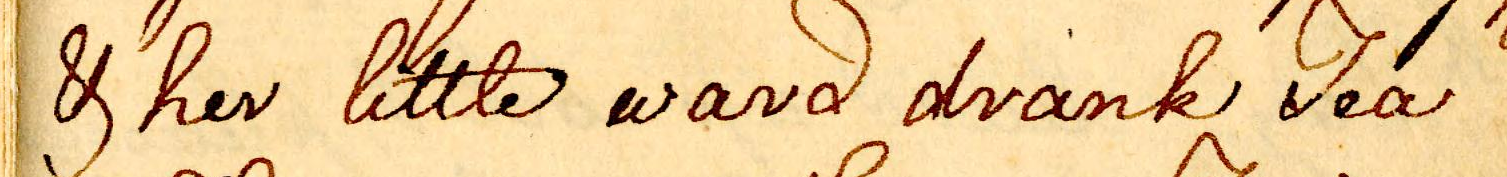& her little ward drank Tea
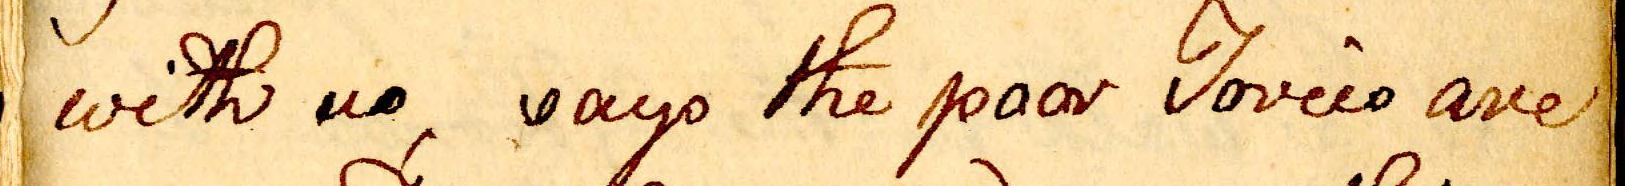with us, says the poor Tories are
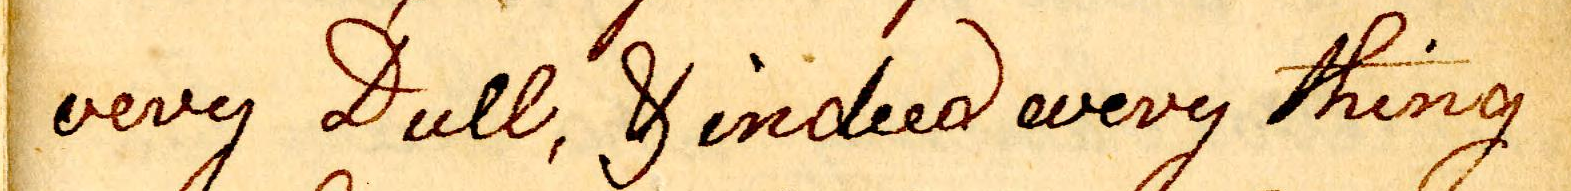very Dull, & indeed every thing
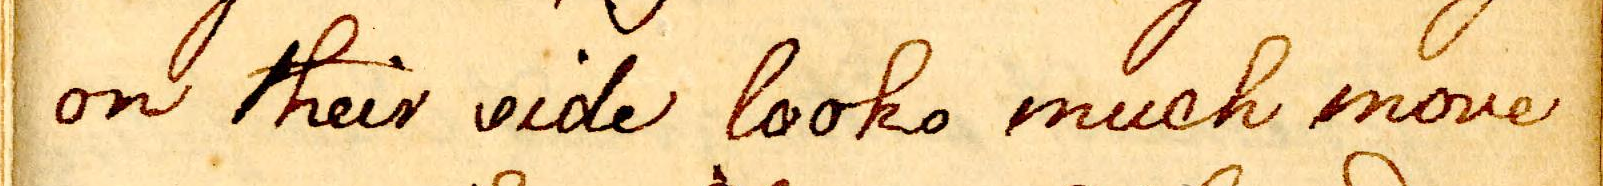on their side looks much more
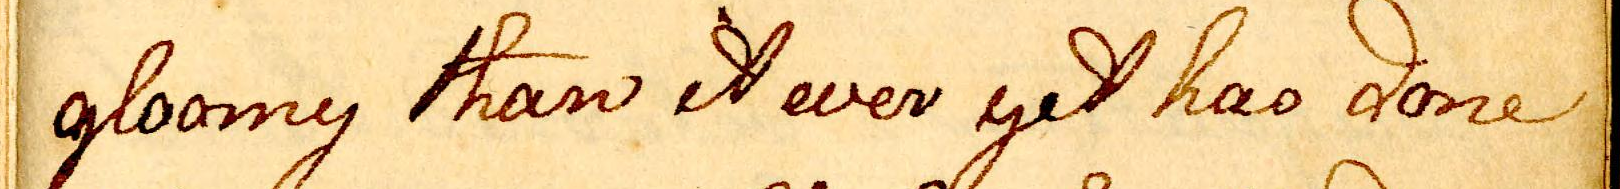gloomy than it ever yet has done
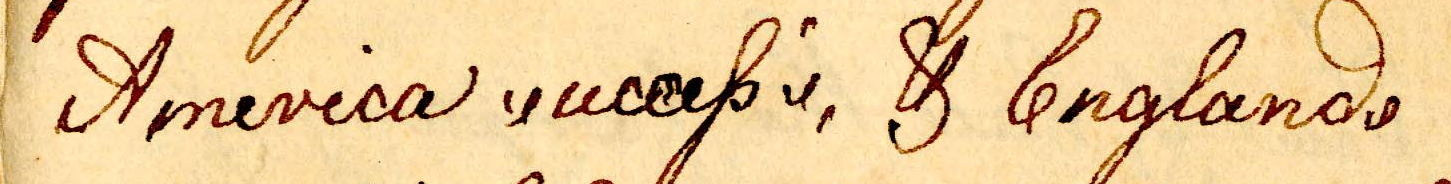America success's, & Englands
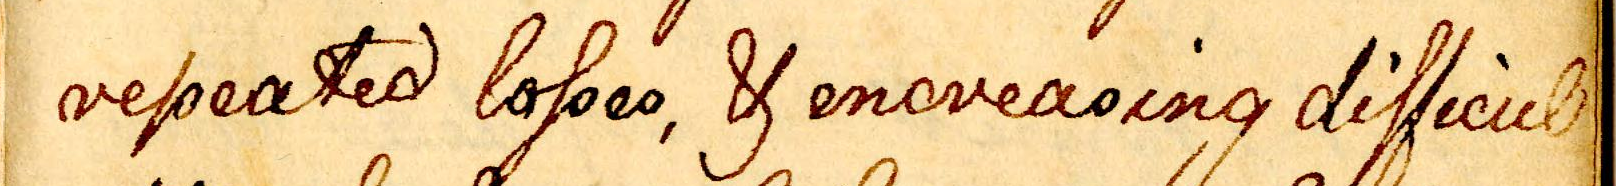repeated losses, & encreasing difficul
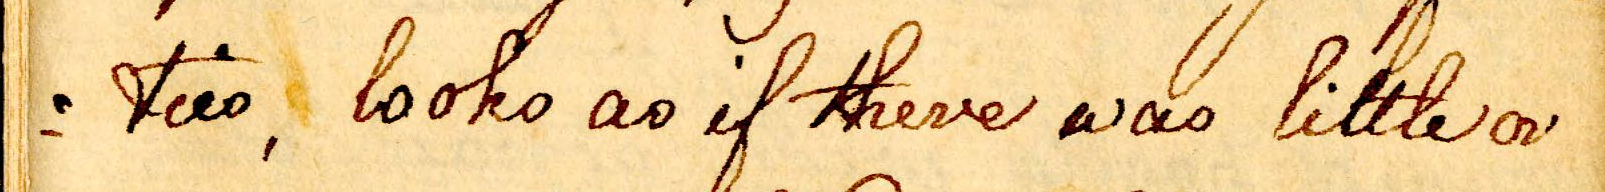-ties, looks as if there was little or
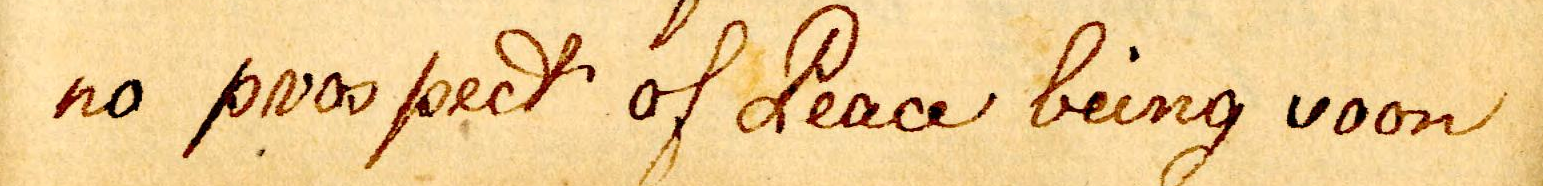no prospect of Peace being soon
